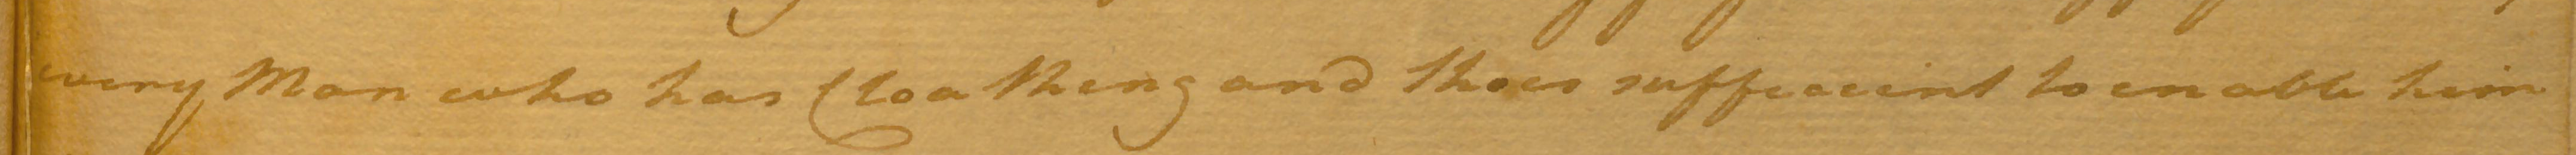every Man who has Cloathing and Shoes sufficient to enable him
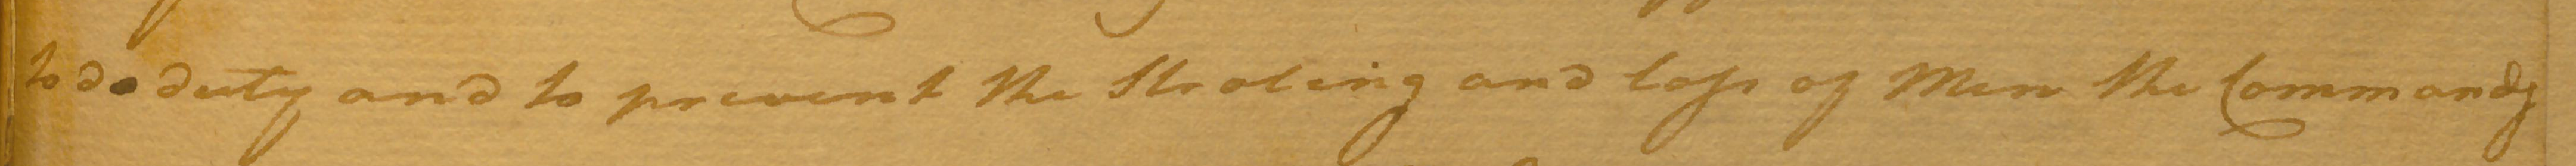to do duty and to prevent the Shooting and loss of Men the Commandg
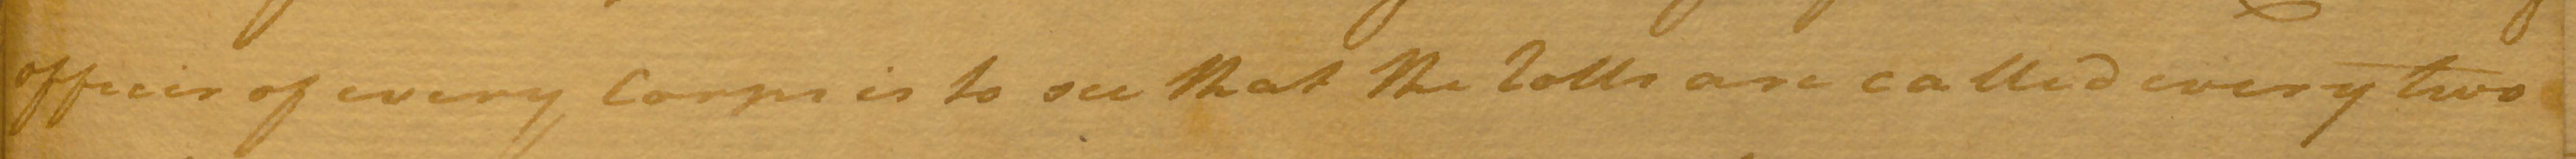officer of every Corps is to see that the rolls are called every two
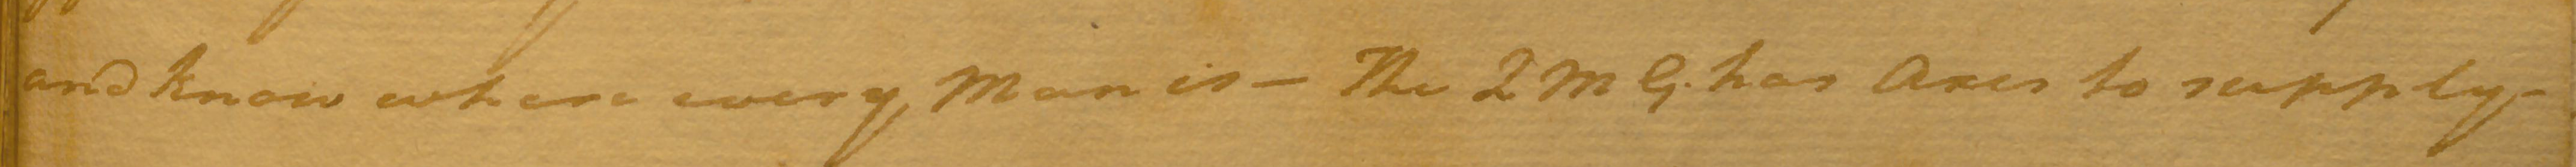and know where every Man is- The QMG. has Arms to supply-
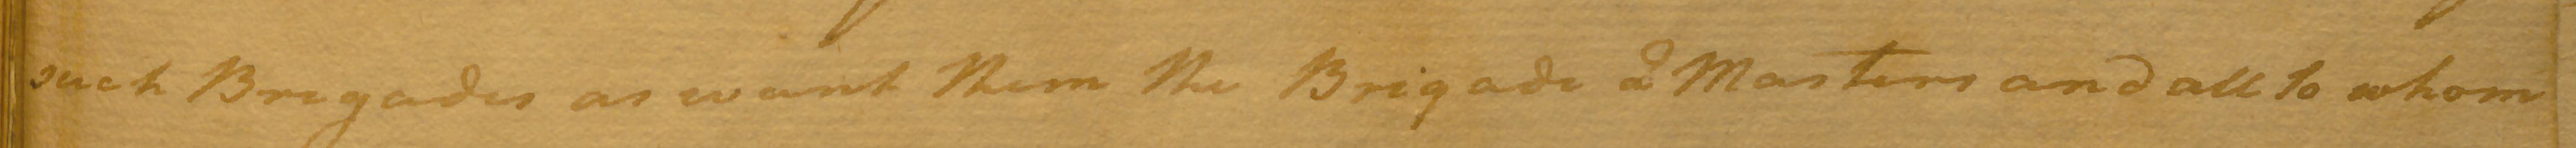such Brigades as want them the Brigade of Masters and all to whom
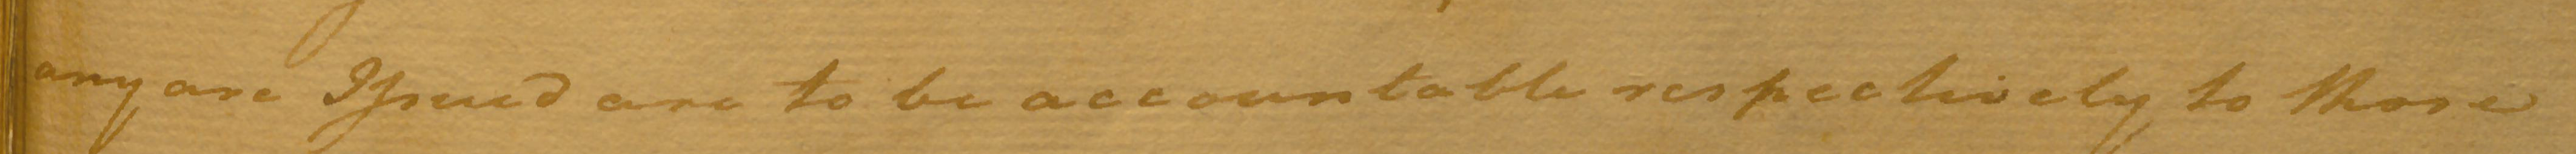any are spread are to be accountable respectively to those
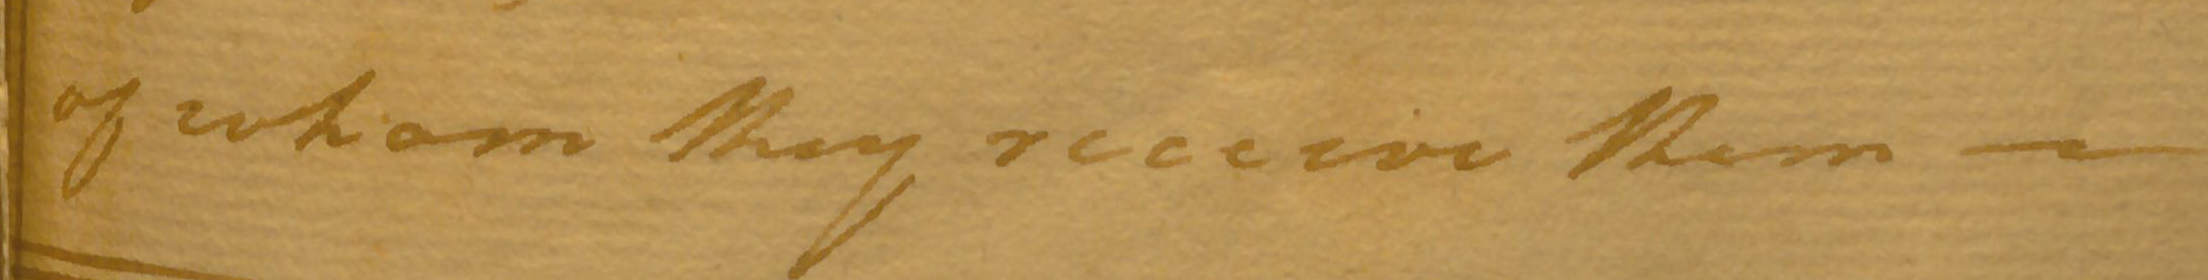of whom they receive them-
